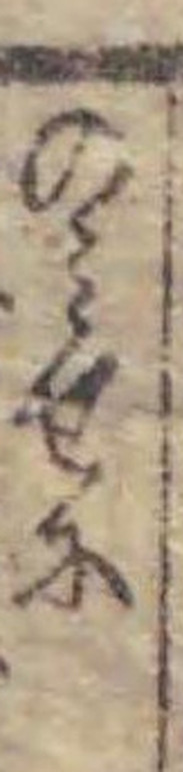のみせに
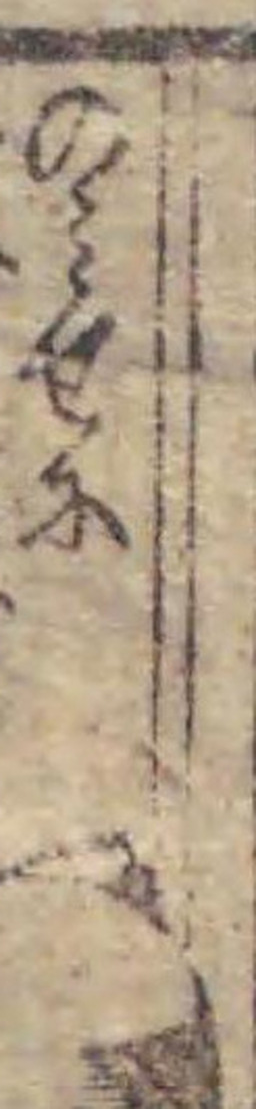のみせに
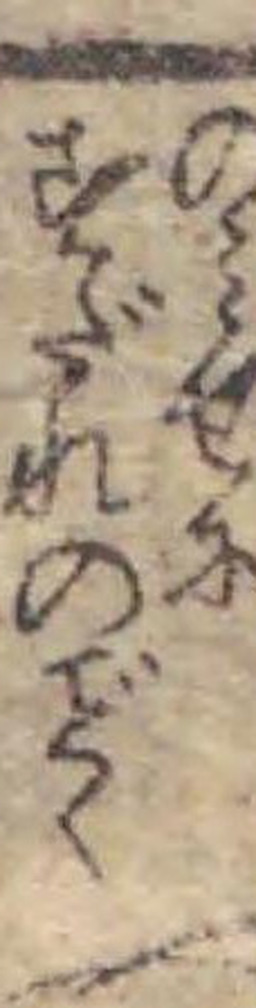すだれのごとく
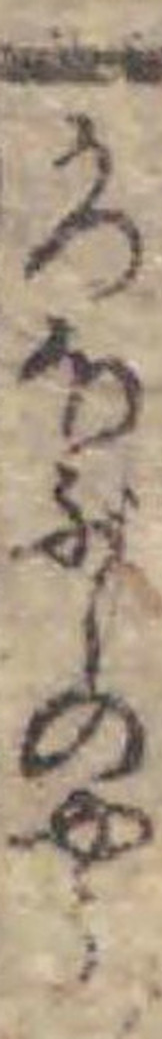かつほぶしのやう
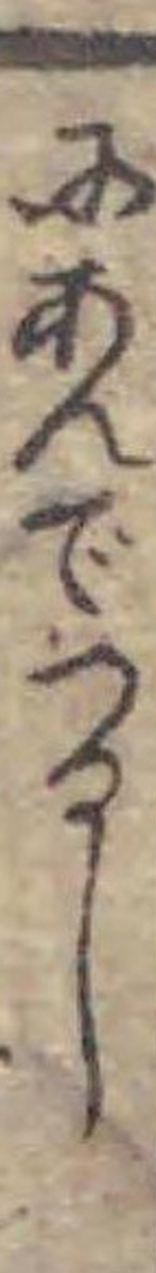にあんでつるし
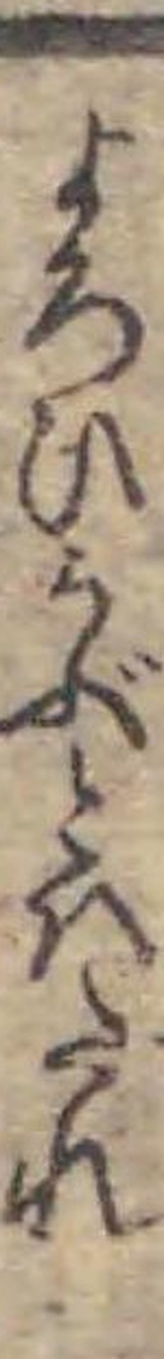よろひかぶとはだれ
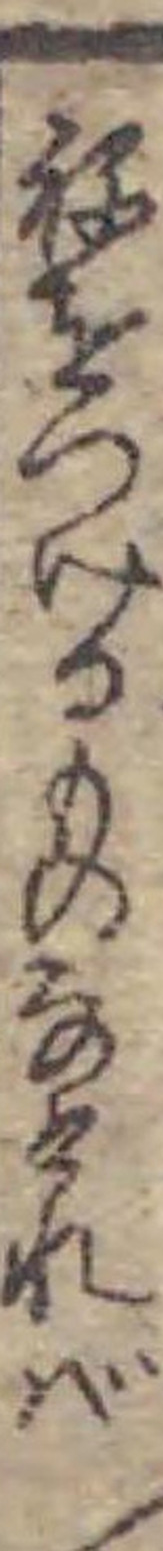ねをつけるものなければ
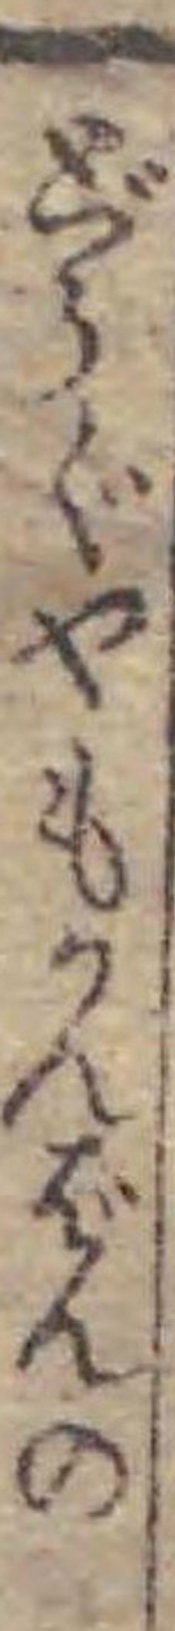どうぐやもかんばんの
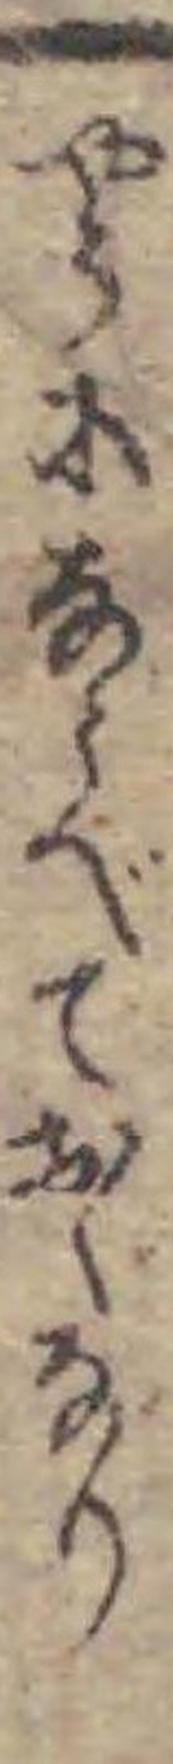やうにならべておくなり
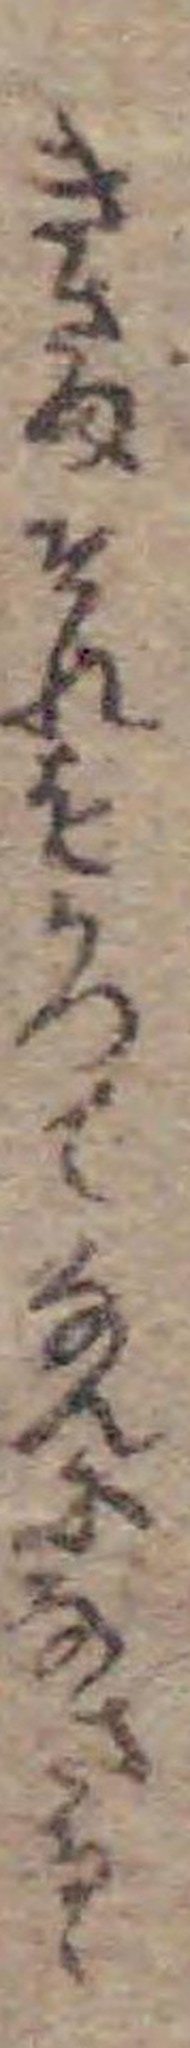きさまそれをかつてなんになさるゝ
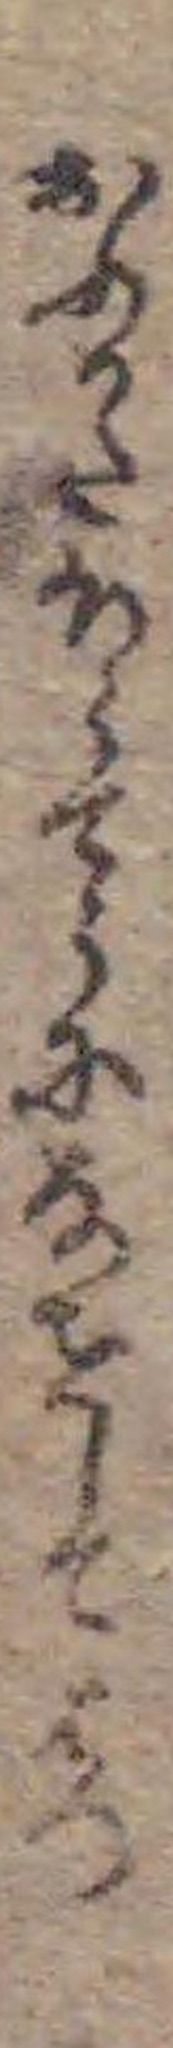おふかたほうてうになをしてはつ
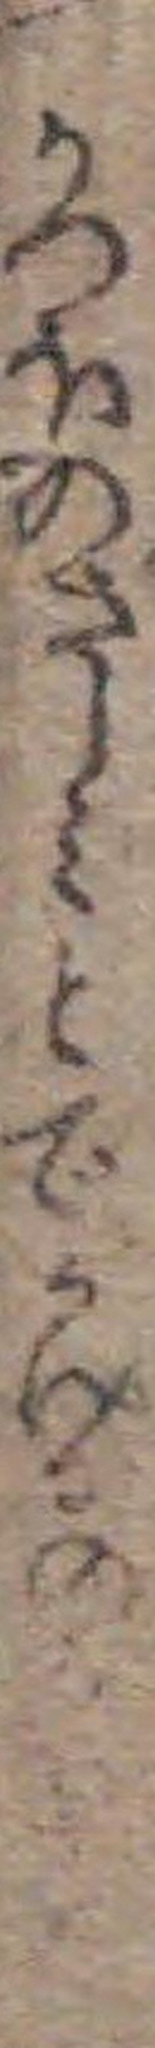かつほのさしみとでかけるのか
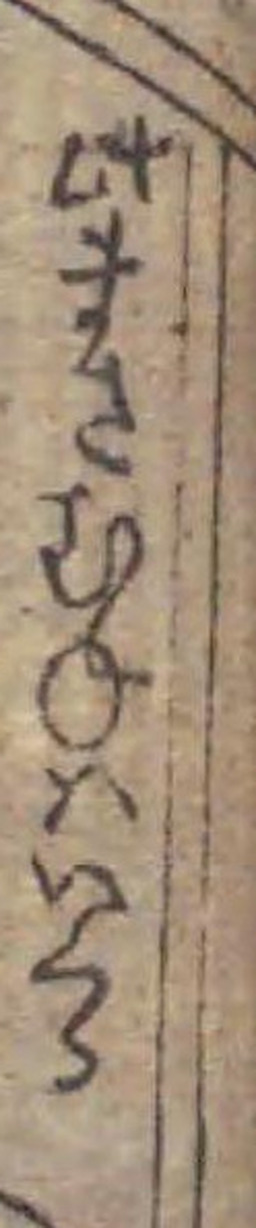此まさむねはいくら
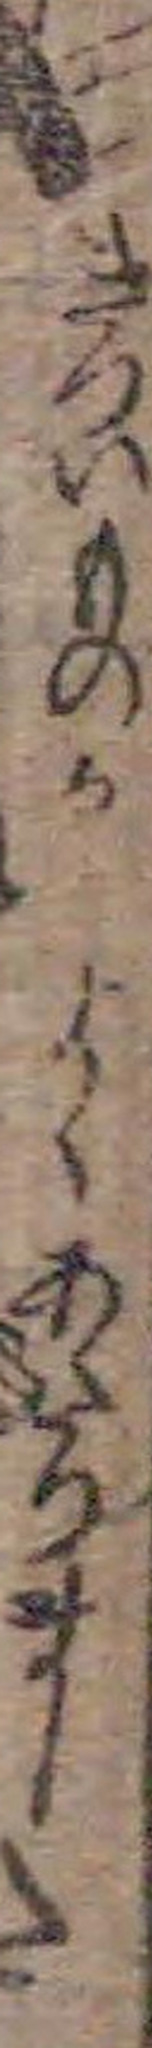きついものかよくあたりました
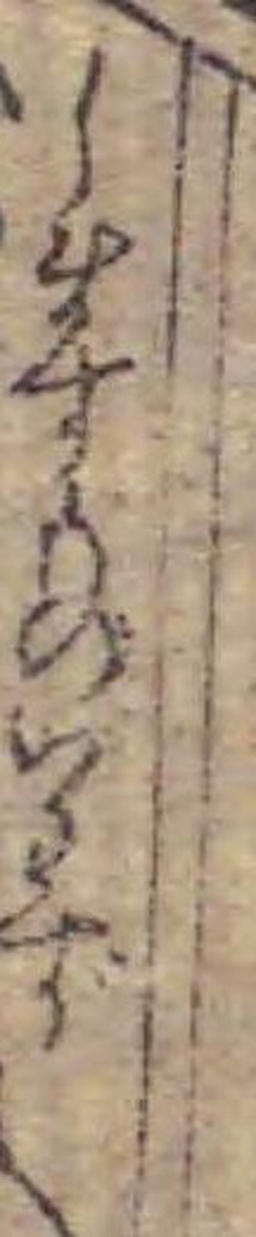しますものいわず
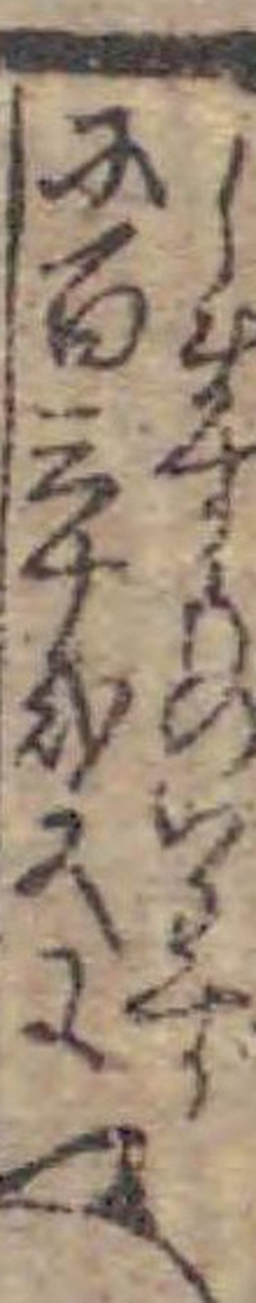に百三十弐文に
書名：威気千代牟物語 : 2巻
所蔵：国立国会図書館 National Diet Library, JAPAN
